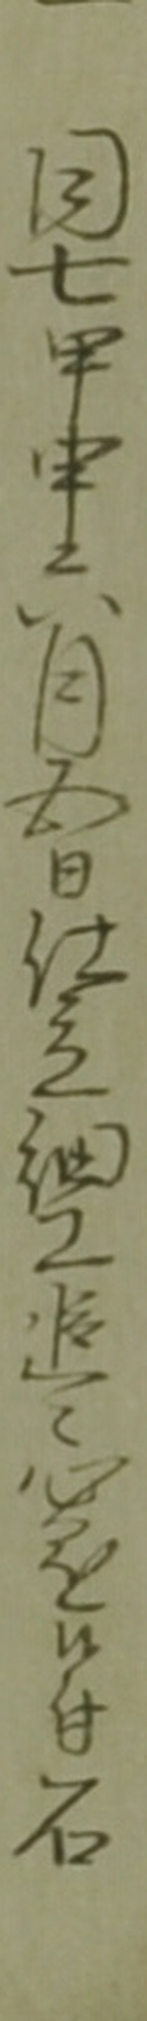一同七甲申六月五日仕立細工追々心懸候付石

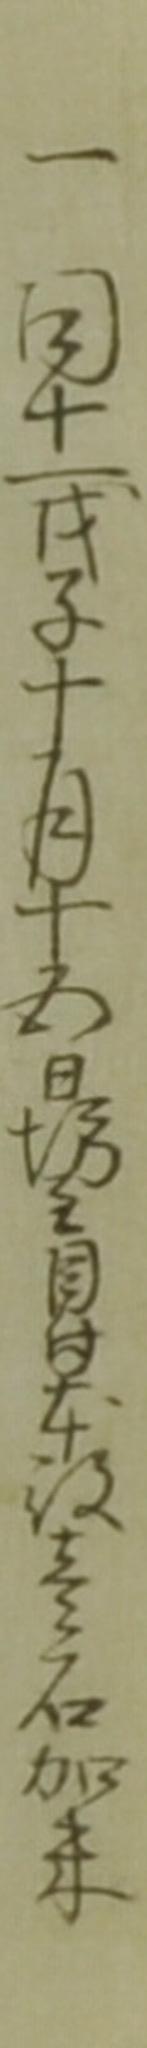一同十一戊子十月十五日坊主目付本役壱石加米
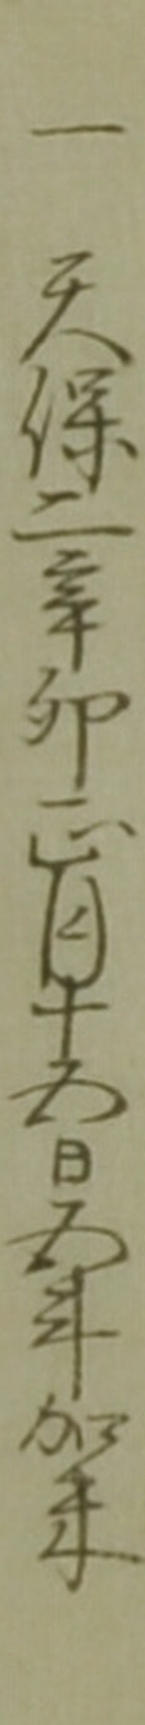一天保二辛卯正月十五日五斗加米
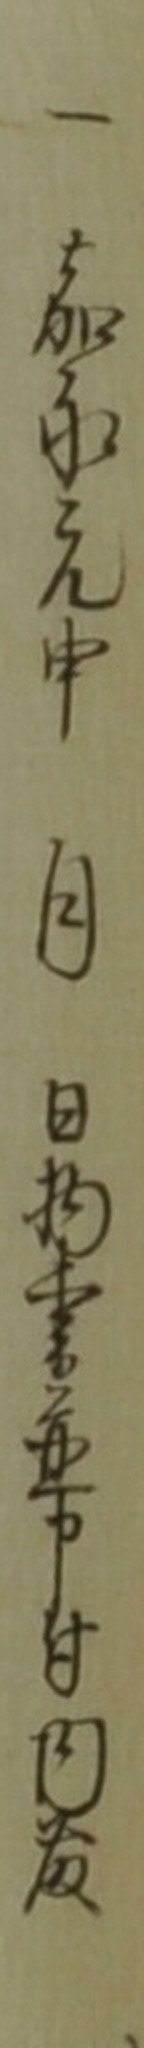一嘉永元申月日物書並申付内藤
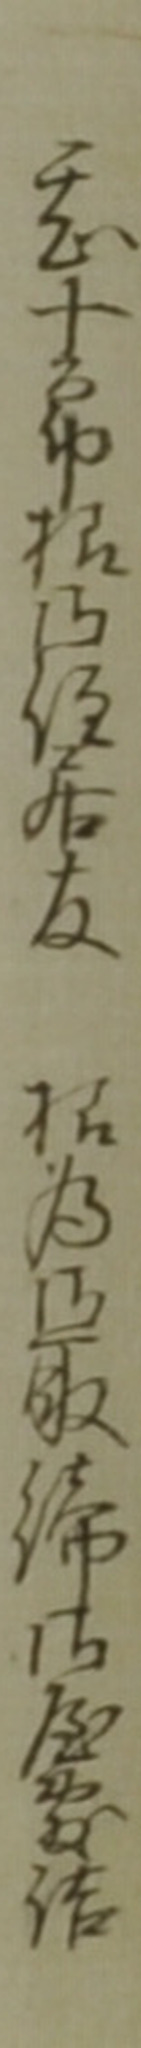甚十郎様御住居友様為御取締御屋敷詰
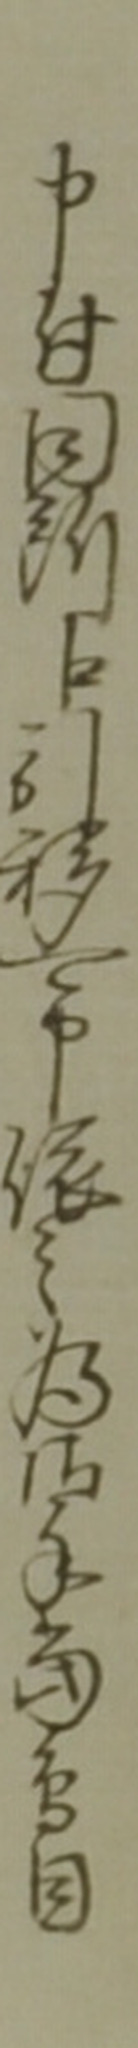申付同所江引移可申依之為御手当鳥目
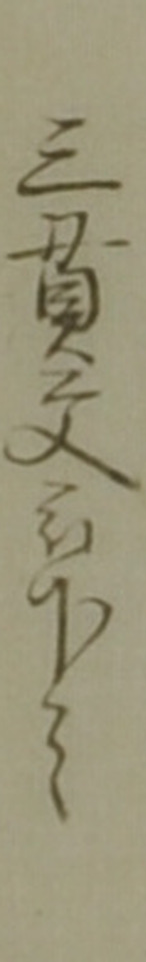三貫文被下之

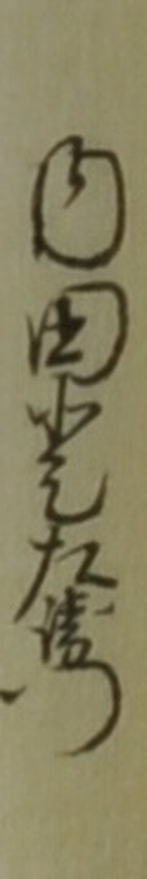内田登左衛門

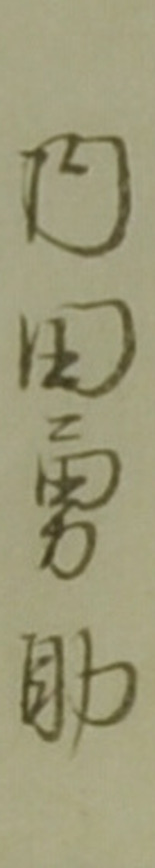内田勇助
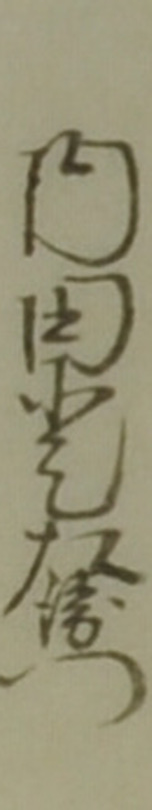内田登左衛門
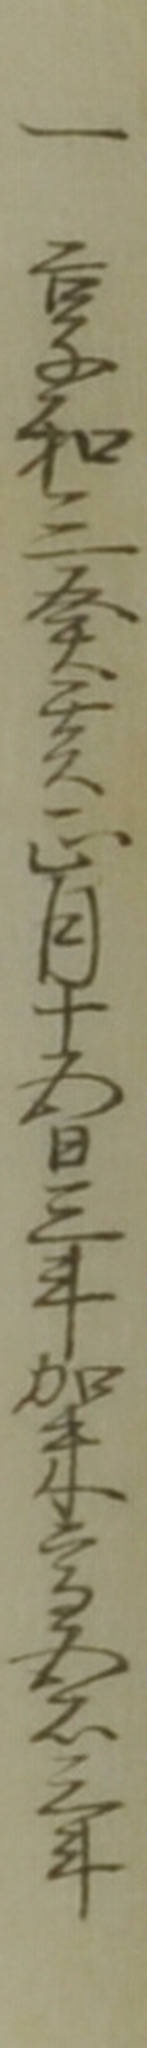一享和三癸亥正月十五日三斗加米高五石三斗
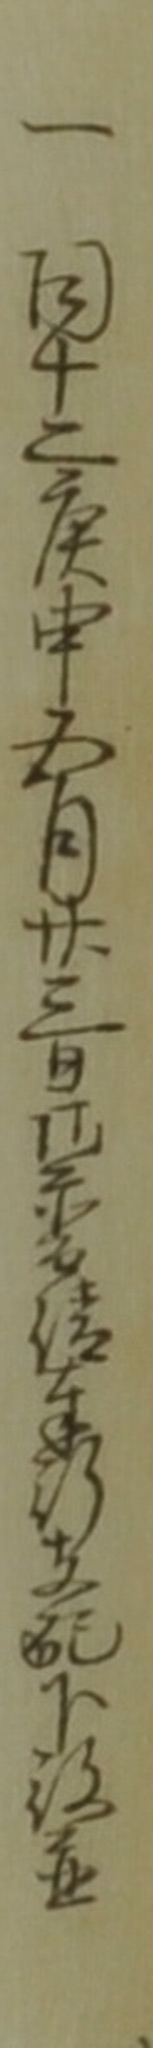一同十二庚申五月廿三日御普請奉行支配下役並
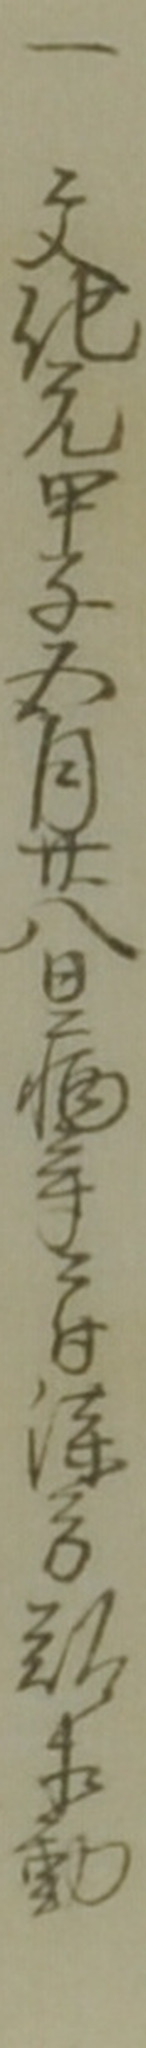一文化元甲子五月廿八日病気ニ付漆方難相勤
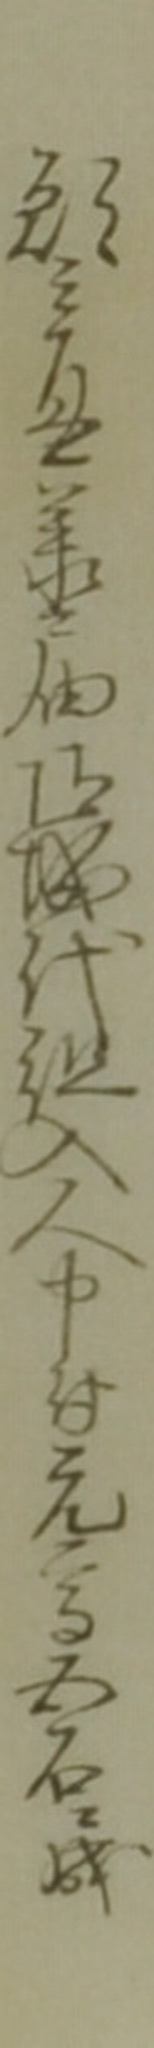願之通承届御城代組入人申付元高五石ニ成
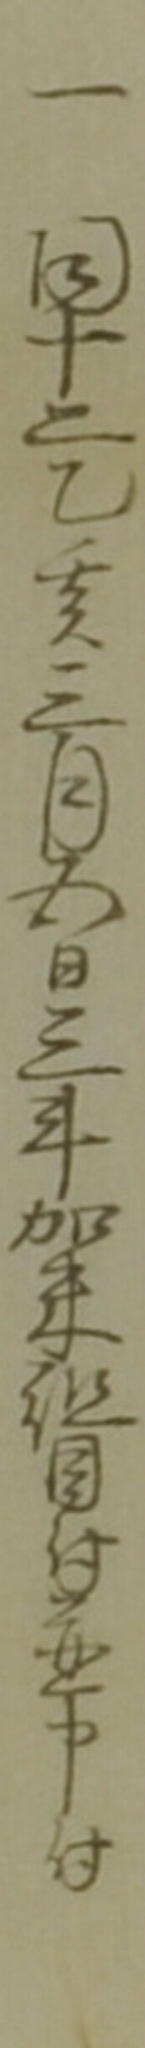一同十二乙亥三月五日三斗加米組目付並申付

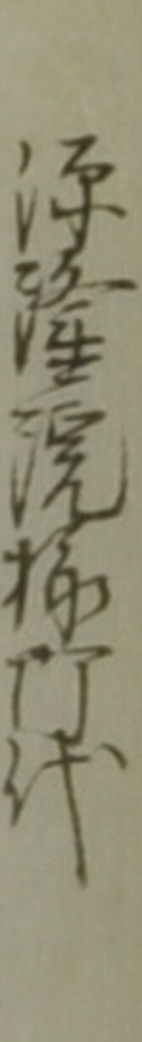源隆院様御代
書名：無足諸士勤仕録（九）
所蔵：伊那市立高遠町図書館・合同会社AMANE
